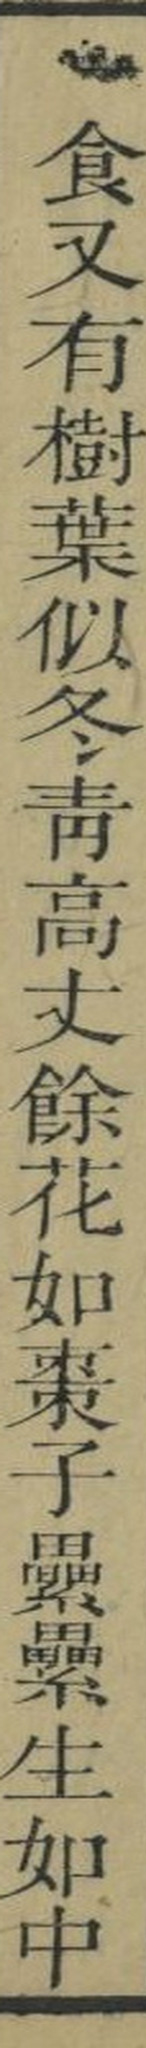食又有樹葉似冬青高丈余花如棗子纍纍生如中
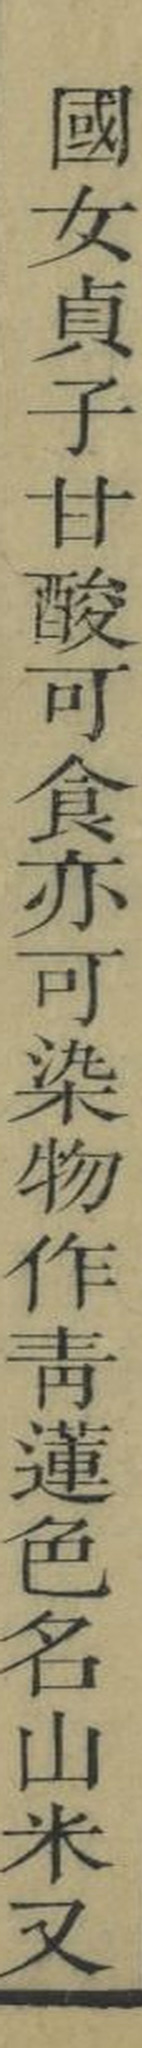国女貞子甘酸可食亦可染物作青蓮色名山米又
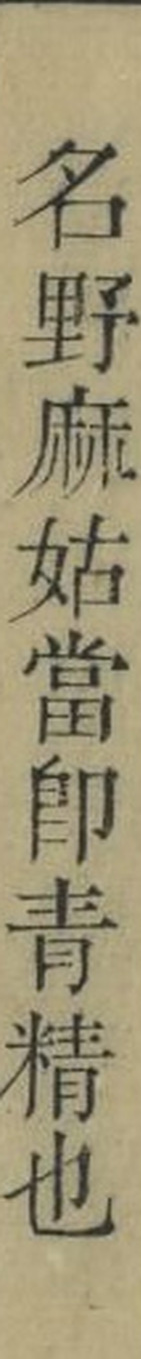名野麻姑当即青精也
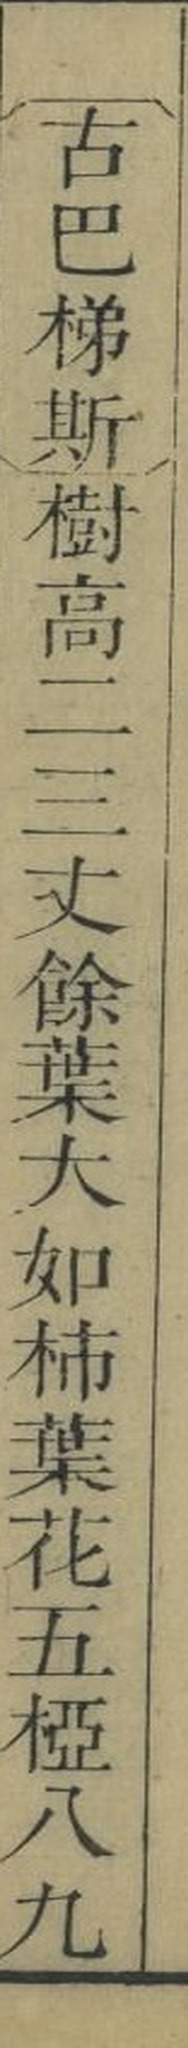[古巴梯斯]樹高二三丈余葉大如柿葉花五椏八九
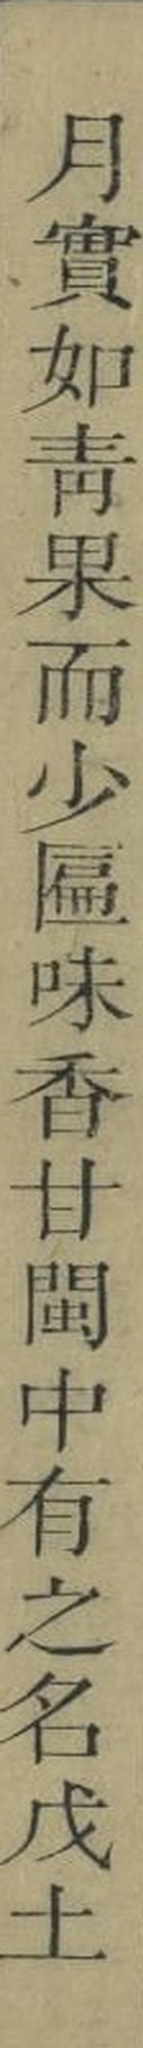月実如青果而少匾味香甘閩中有之名戊土
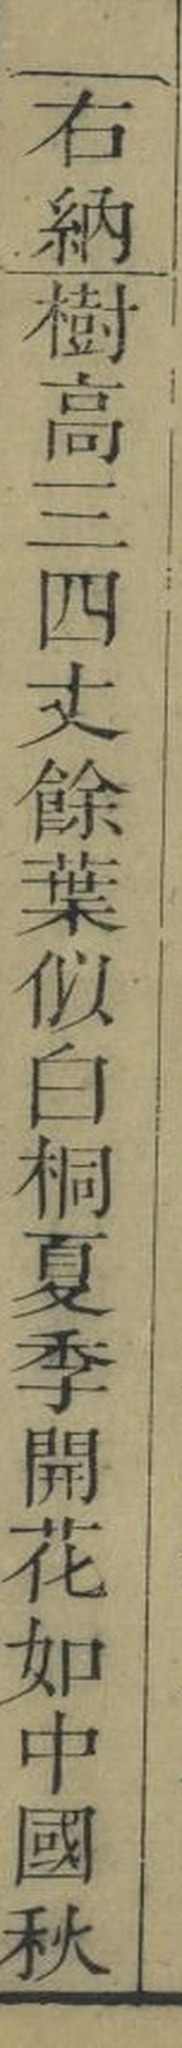[右納]樹高三四丈余葉似白桐夏季開花如中国秋
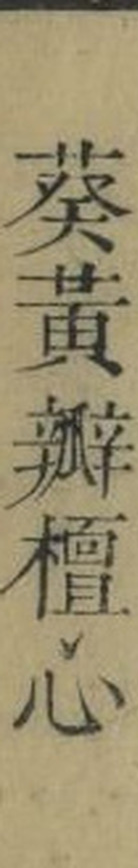葵黄弁檀心

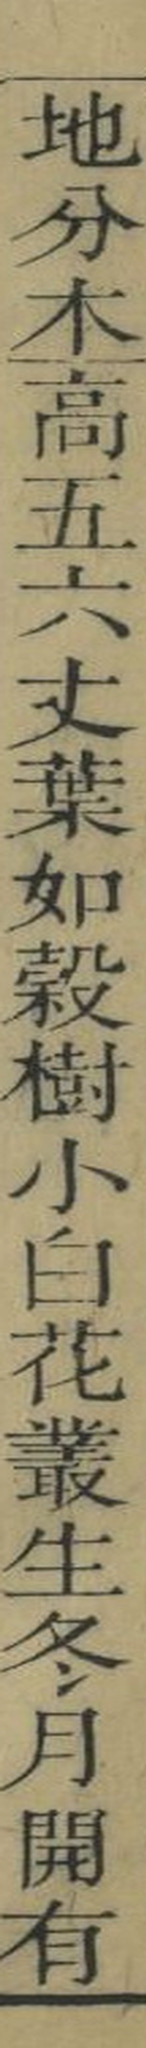[地分木]高五六丈葉如穀樹小白花叢生冬月開有
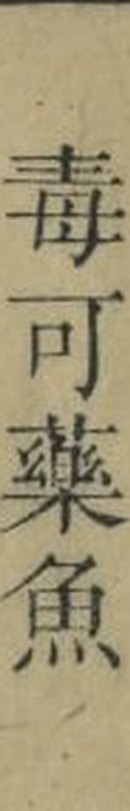毒可薬魚
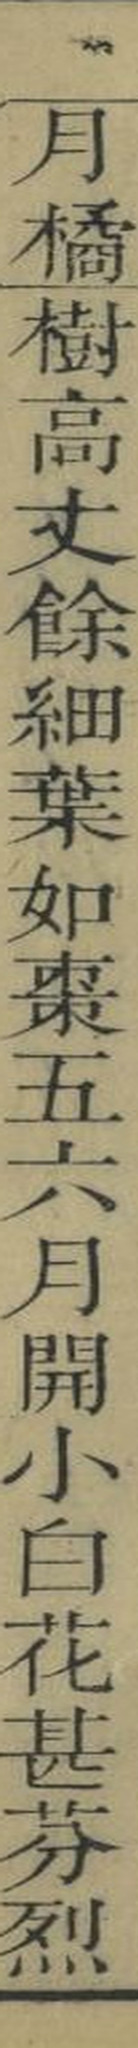[月橘]樹高丈余細葉如棗五六月開小白花甚芬烈
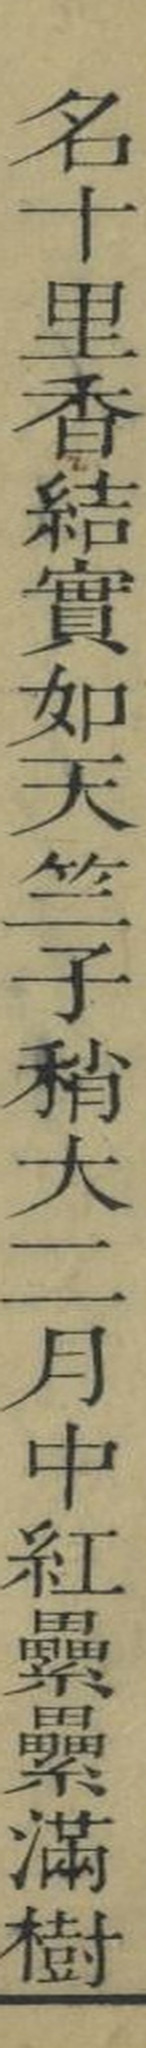名十里香結実如天竺子稍大二月中紅纍纍満樹
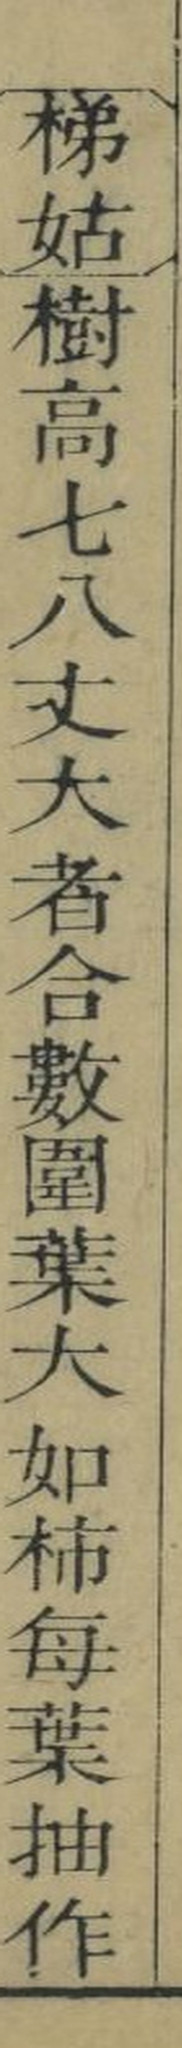[梯姑]樹高七八丈大者合数囲葉大如柿毎葉抽作
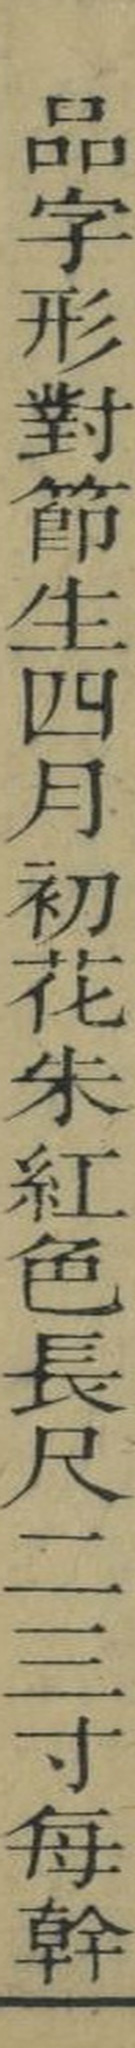品字形対節生四月初花朱紅色長尺二三寸毎幹
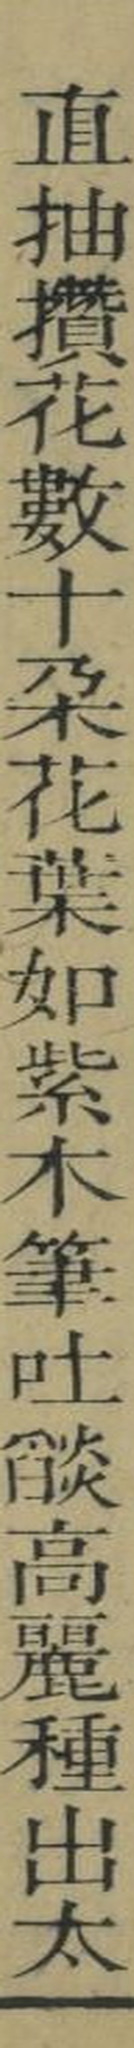直抽攢花数十朶花葉如柴木筆吐燄高麗種出太
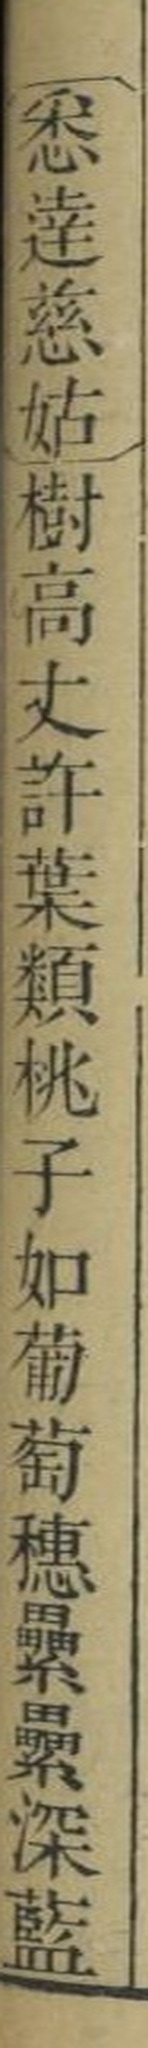[悉達慈姑]樹高丈許葉類桃子如葡萄穂纍纍深藍
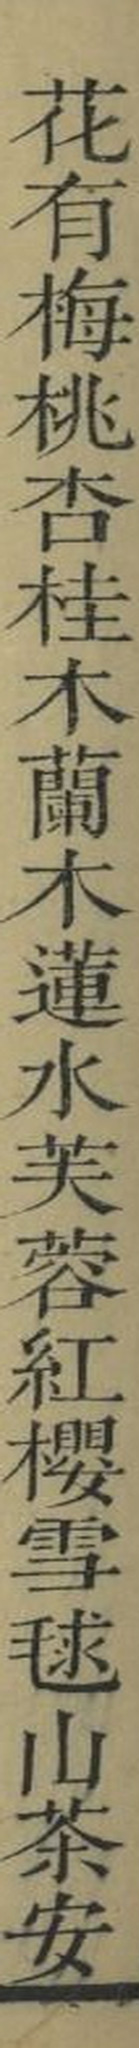花有梅桃杏桂木蘭木蓮水芙蓉紅桜雪毬山茶安
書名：中山伝信録 巻六
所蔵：University of the Ryukyus Library
